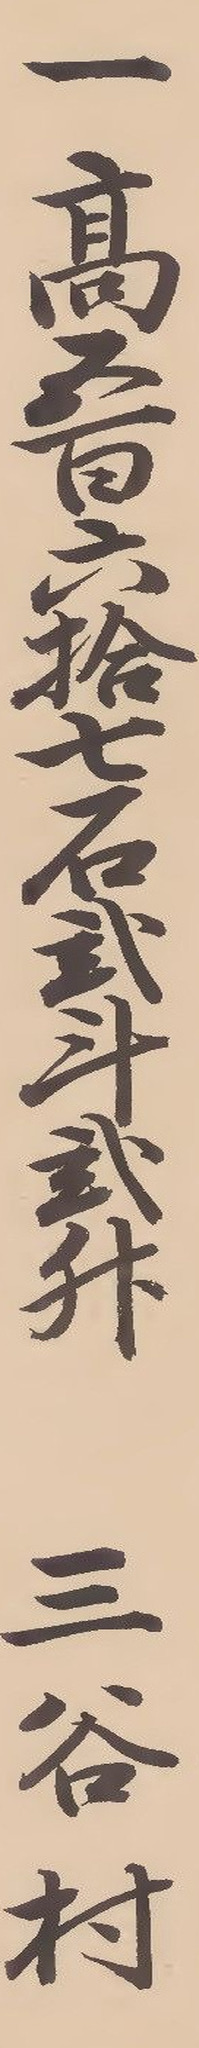一高五百六拾七石弐斗弐升三谷村
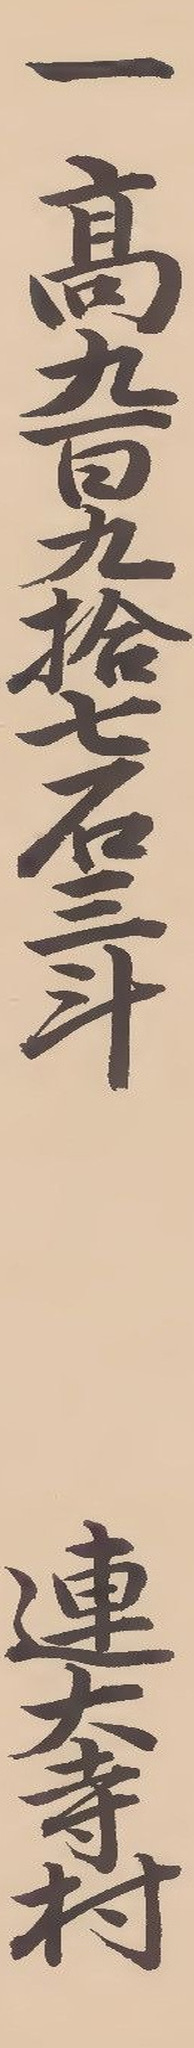一高九百九拾七石三斗連大寺村
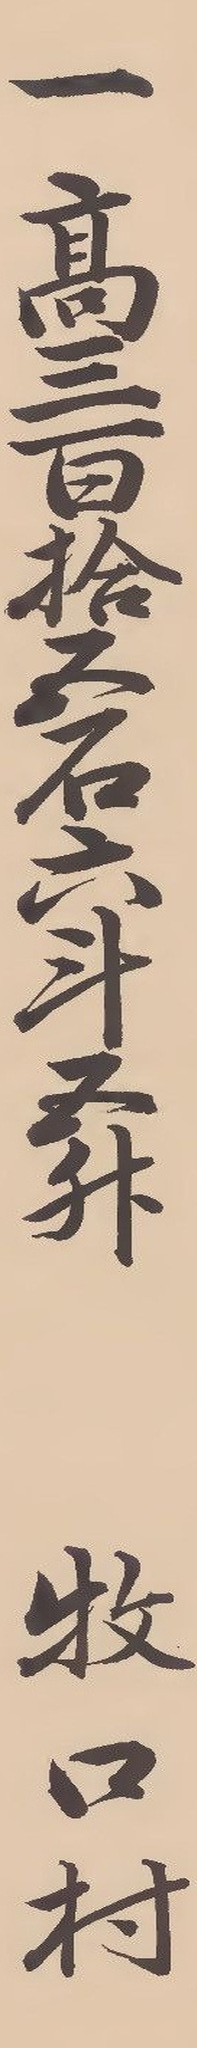一高三百拾五石六斗五升牧口村
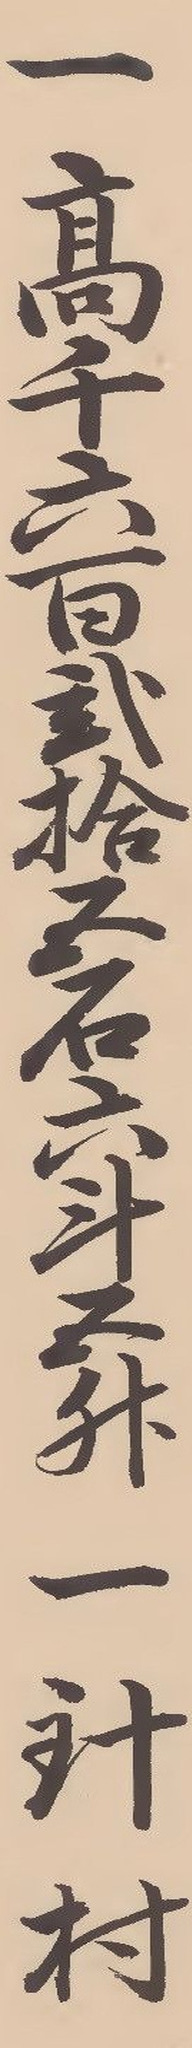一高千六百弐拾五石六斗五升一針村
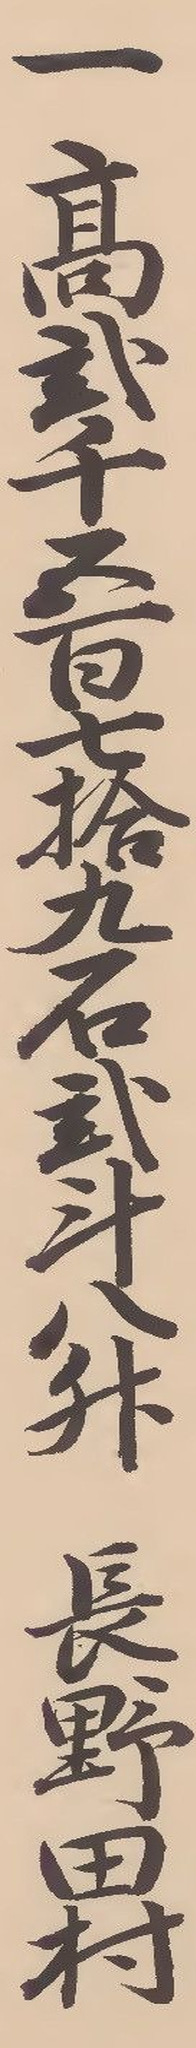一高弐千五百七拾九石弐斗八升長野田村

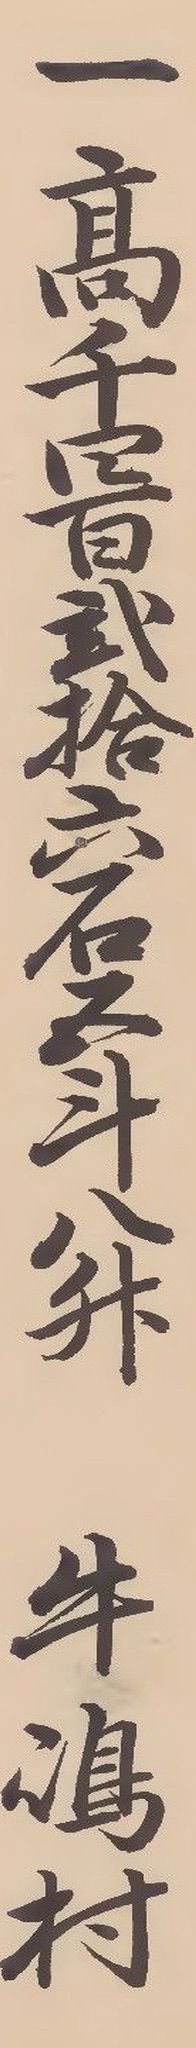一高千四百弐拾六石五斗八升牛島村
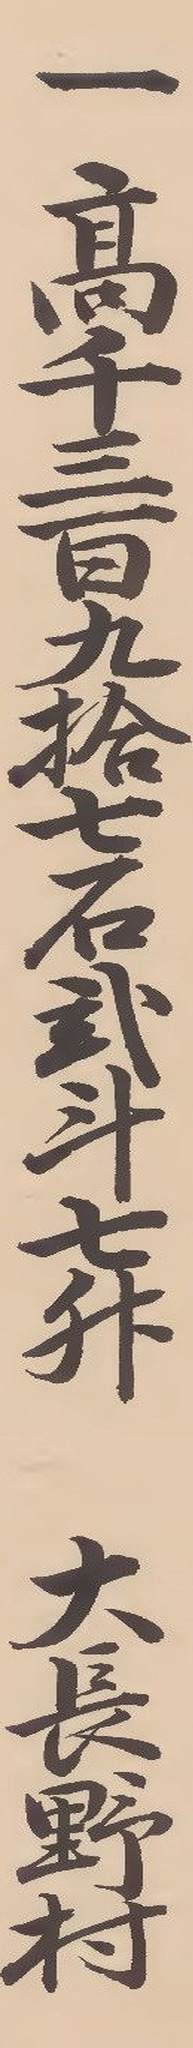一高千三百九拾七石弐斗七升大長野村
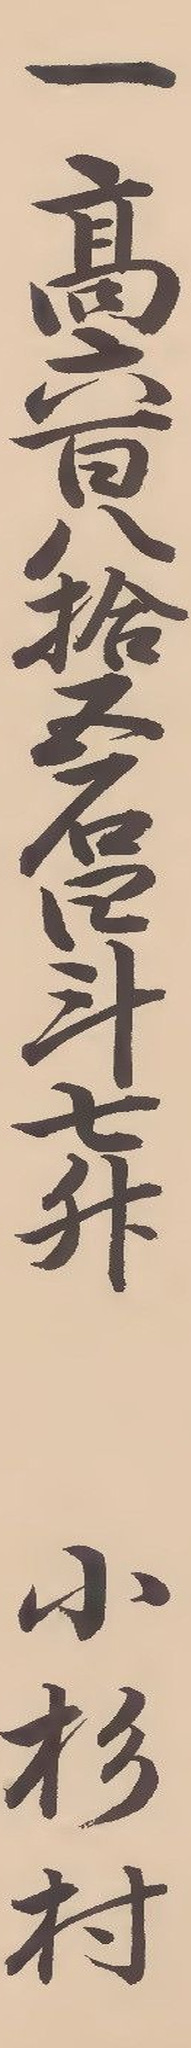一高六百八拾五石四斗七升小杉村
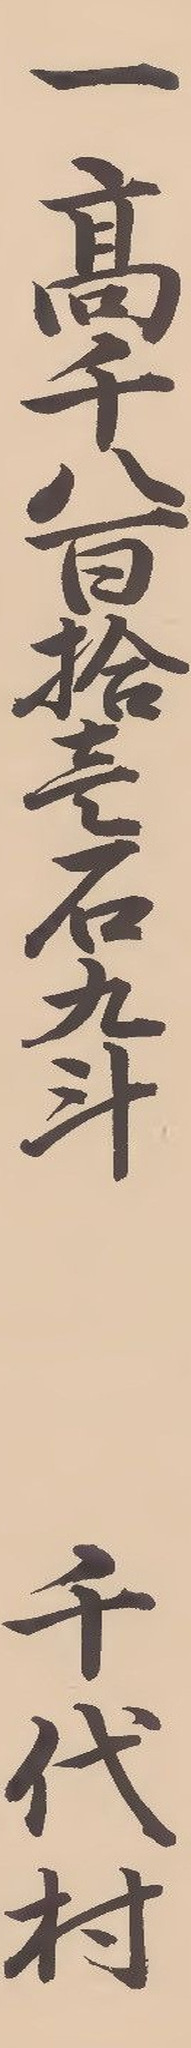一高千八百拾壱石九斗千代村
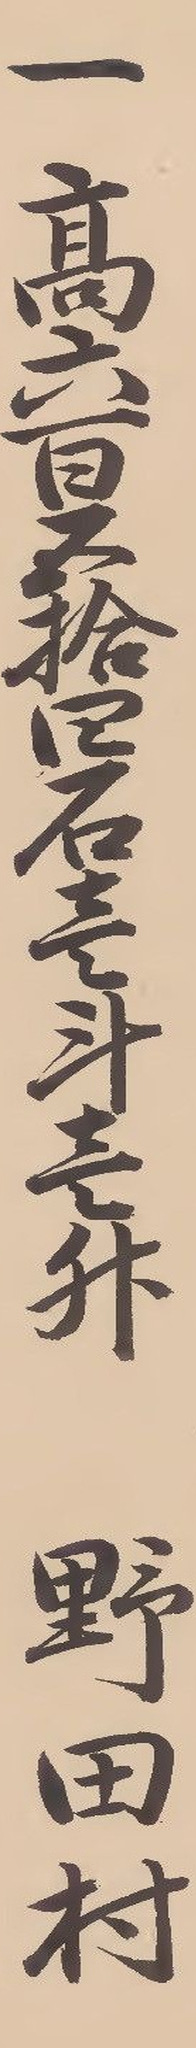一高六百五拾四石壱斗壱升野田村
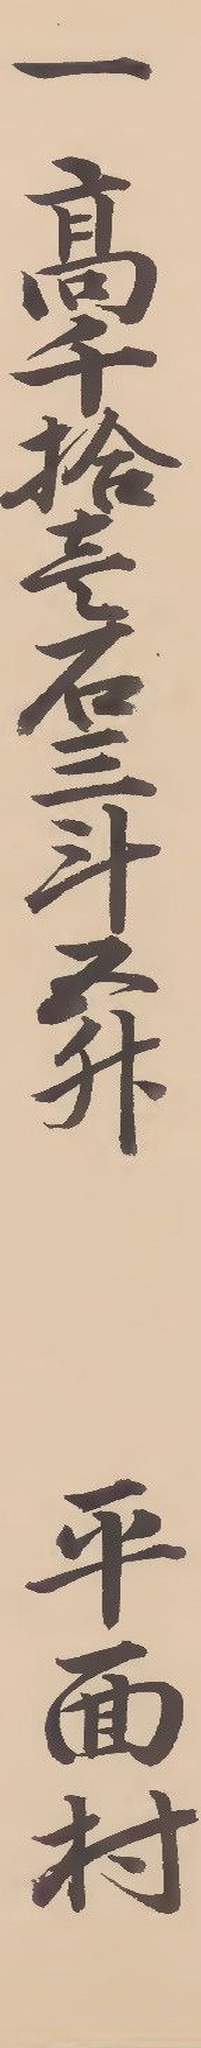一高千拾壱石三斗五升平面村
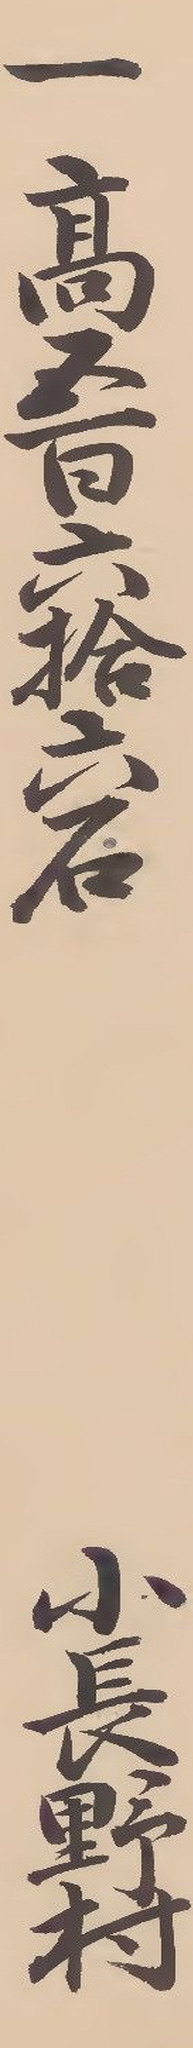一高五百六拾六石小長野村

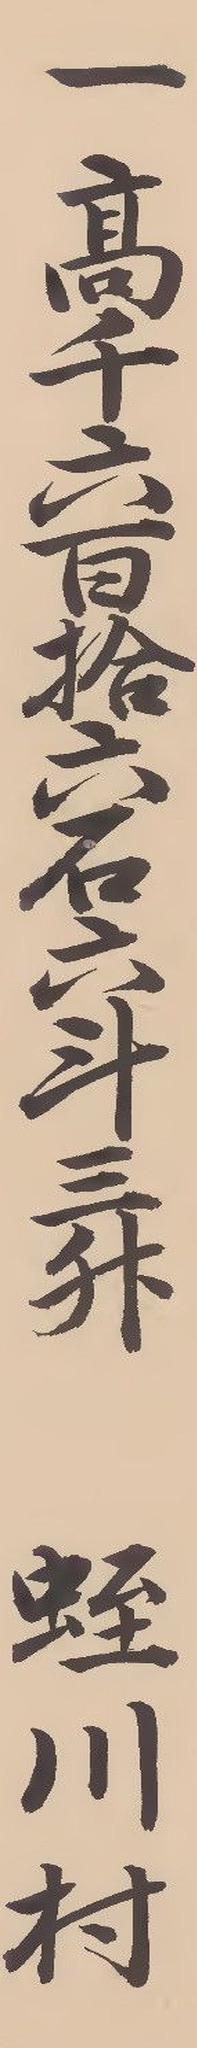一高千六百拾六石六斗三升蛭川村
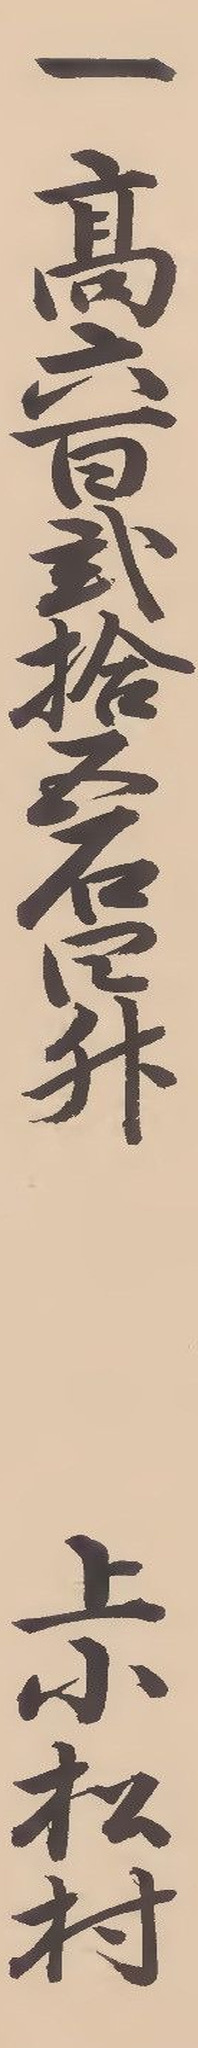一高六百弐拾五石四升上小松村
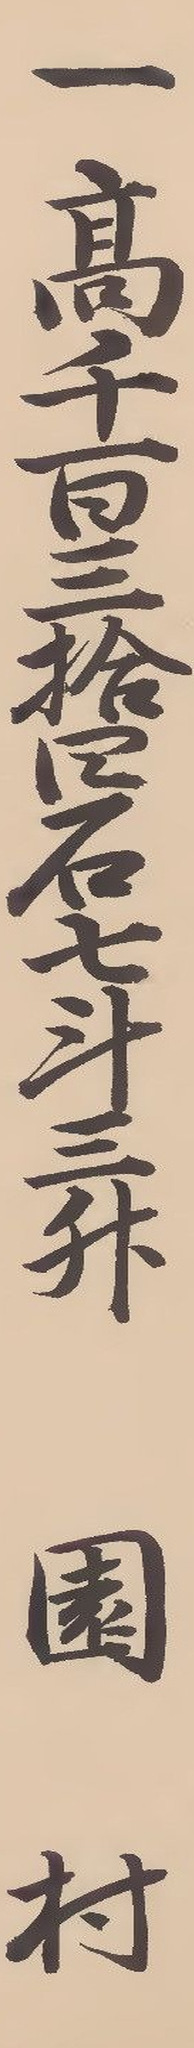一高千百三拾四石七斗三升園村
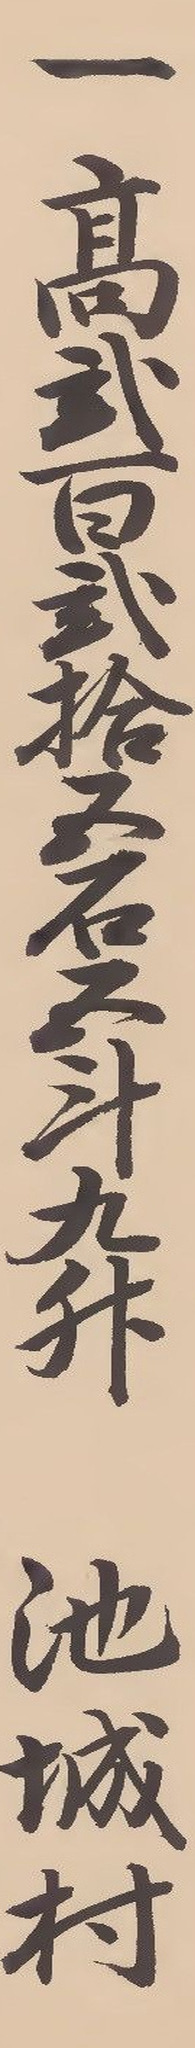一高弐百弐拾五石五斗九升池城村
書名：加賀国郷帳
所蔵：国立公文書館 National Archives of Japan
